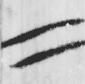二
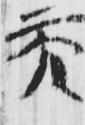天
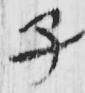子
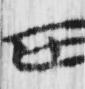甲
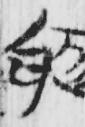寅
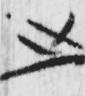之
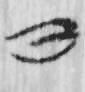日
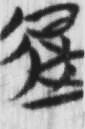逗
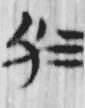於
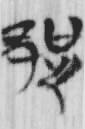○（枝）
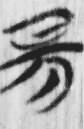昜（陽）
